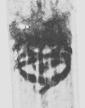昔
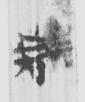者
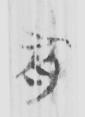歬
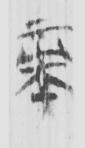帝
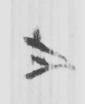之
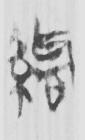紿
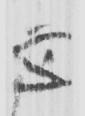正
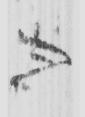之
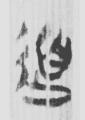道
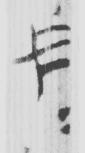{上下}=
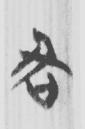各
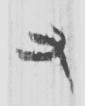又
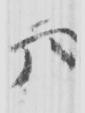亓
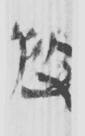攸
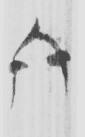夂
